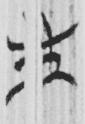生
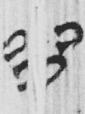厽（三）
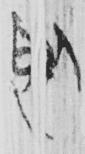○（食）
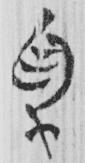色
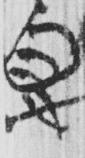○（息）
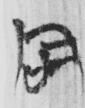含（今）
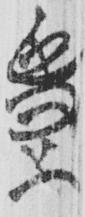○（豎）
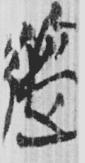○（刁）
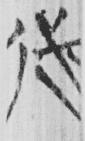佖（匹）
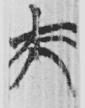夫
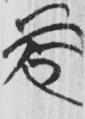而
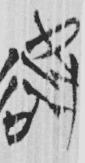欲
